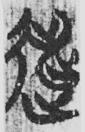逃
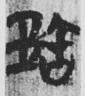珤
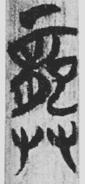龏（龔）
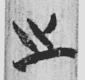之
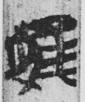（脽）
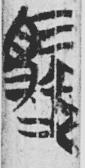○（馭）
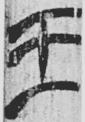王
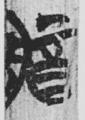𨟻（將）
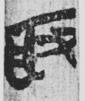取
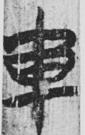車
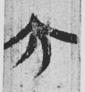大
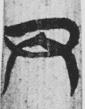尹
